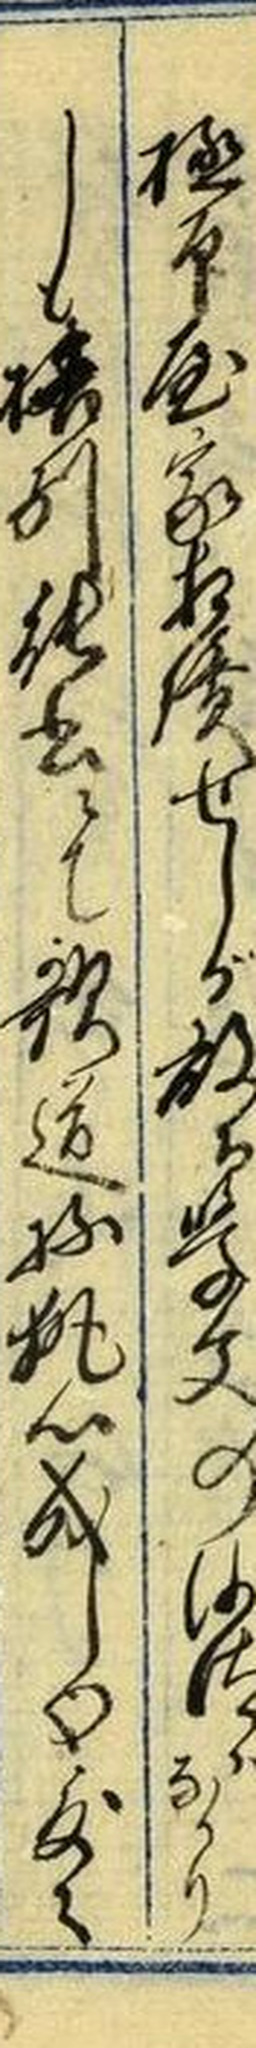しか格別能書ニて歌道抔執心成しや度々
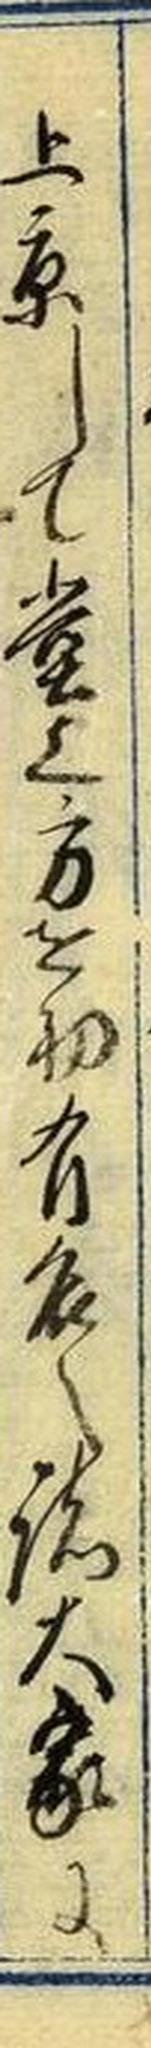上京して堂上方を初有名之諸大家に
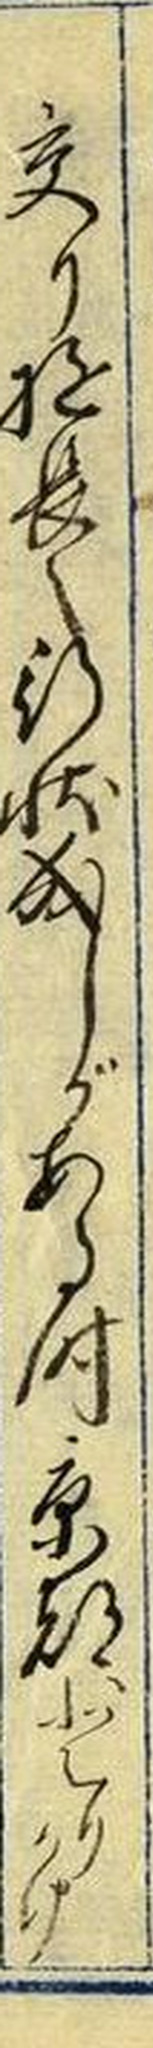交り遊長之行状成しがある時京都へ登りかけ
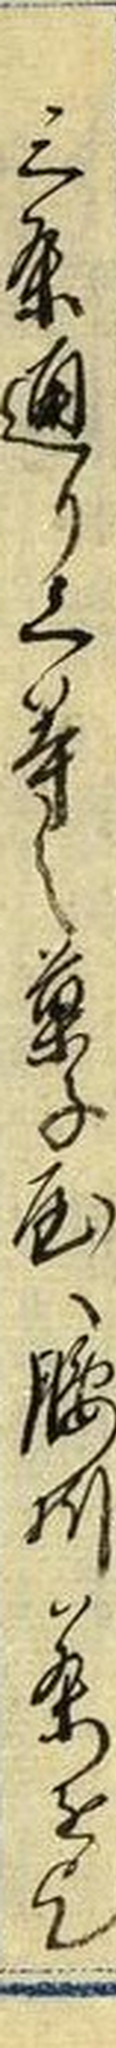三条通り上等之菓子屋へ腰掛茶を乞
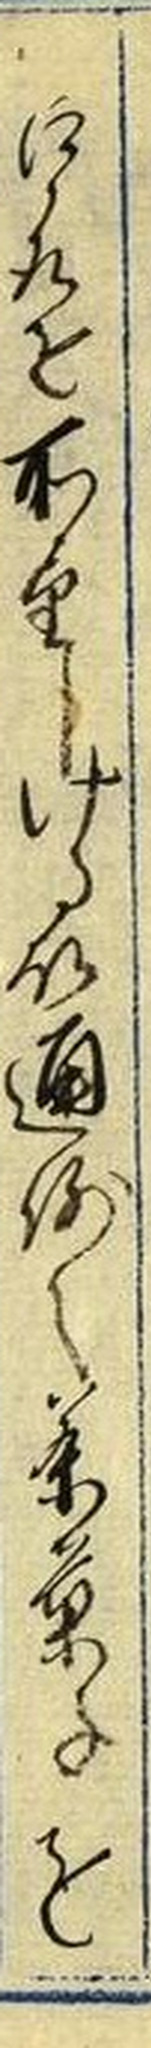口取を所望しける故通例之茶菓子を
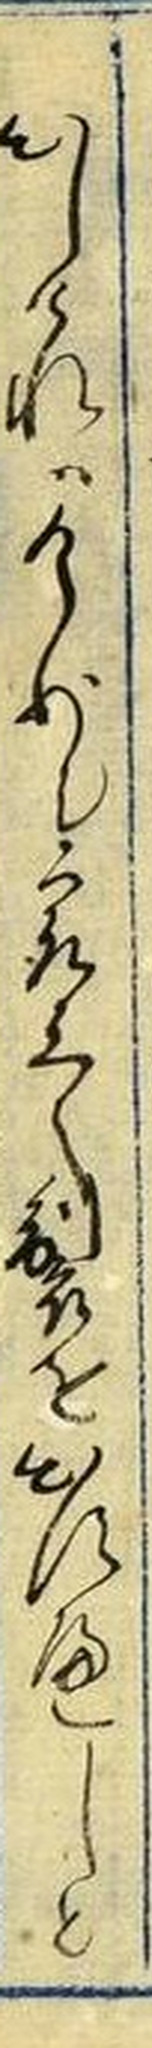出しけれハ今少し最上之製を出すへしと

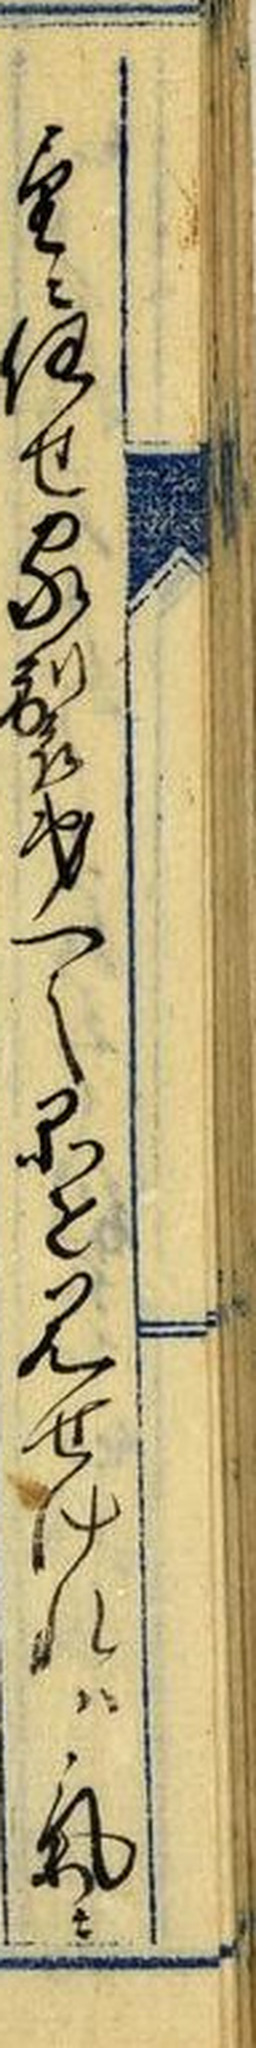金ニ任せ家製第一之品を見せけれハ気ニ
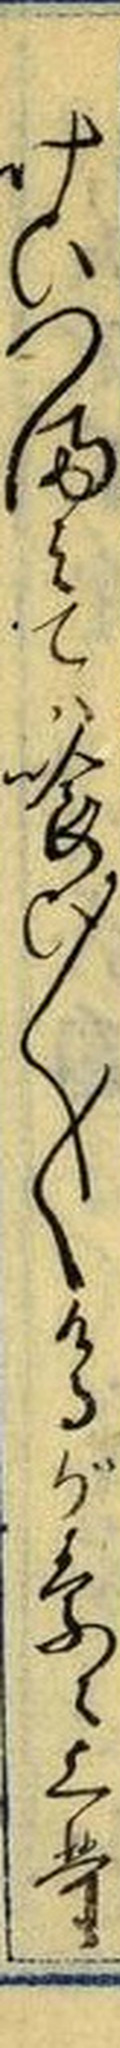叶ひつまミてハ喰ひ〳〵〳〵けるが素々上等
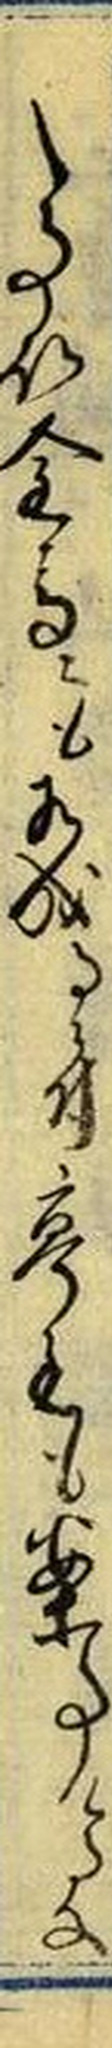之事故金高ニも相成るニ付亭主も案事けるに
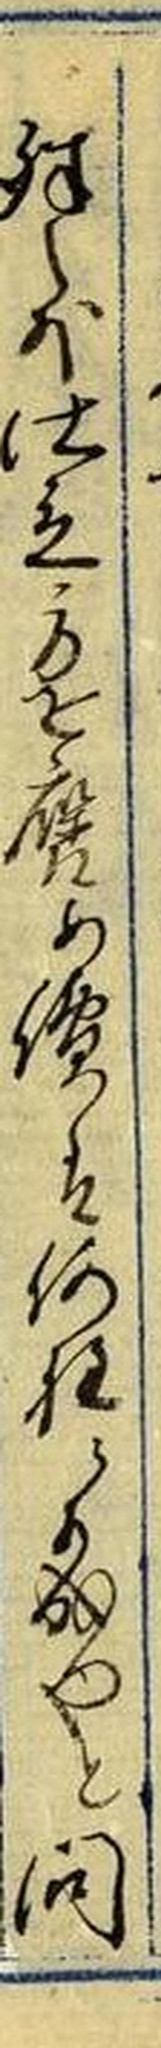殊之外仕立方を褒め価は何程ニ相成やと問
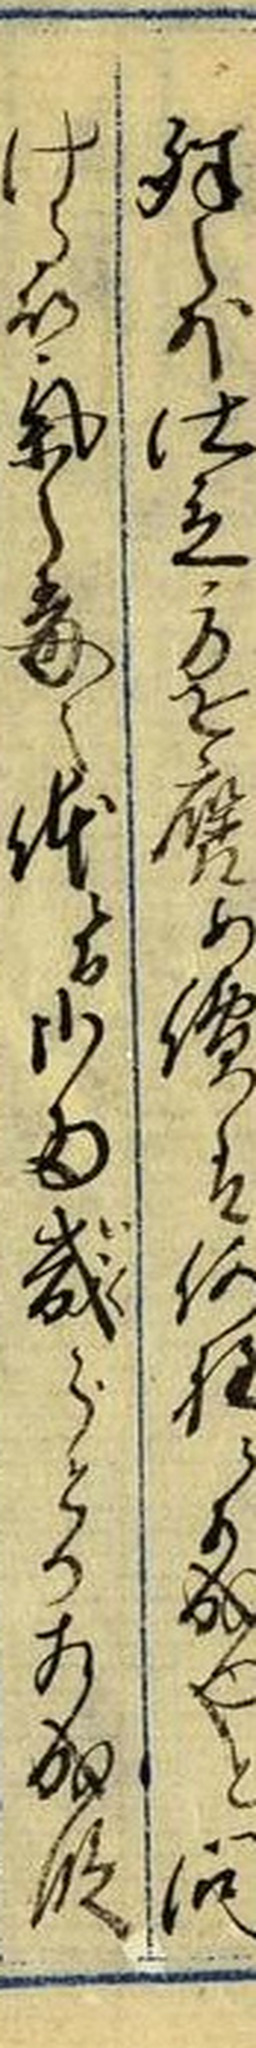ける故気之毒之体ニ而弐両幾らとか相成段
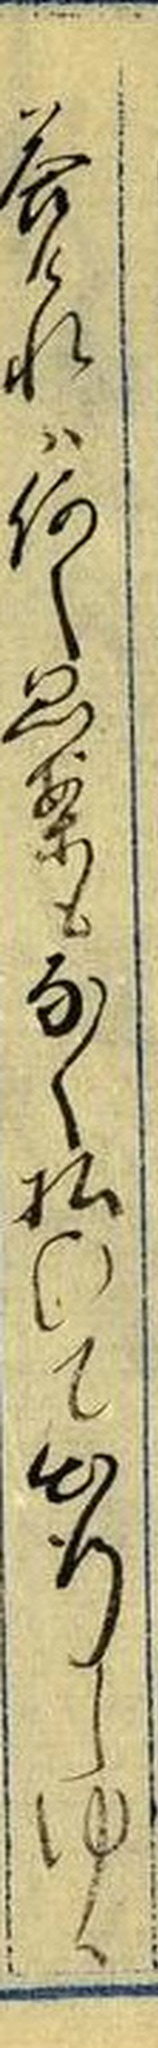答けれハ何之思案もなく払ひて出行しゆへ
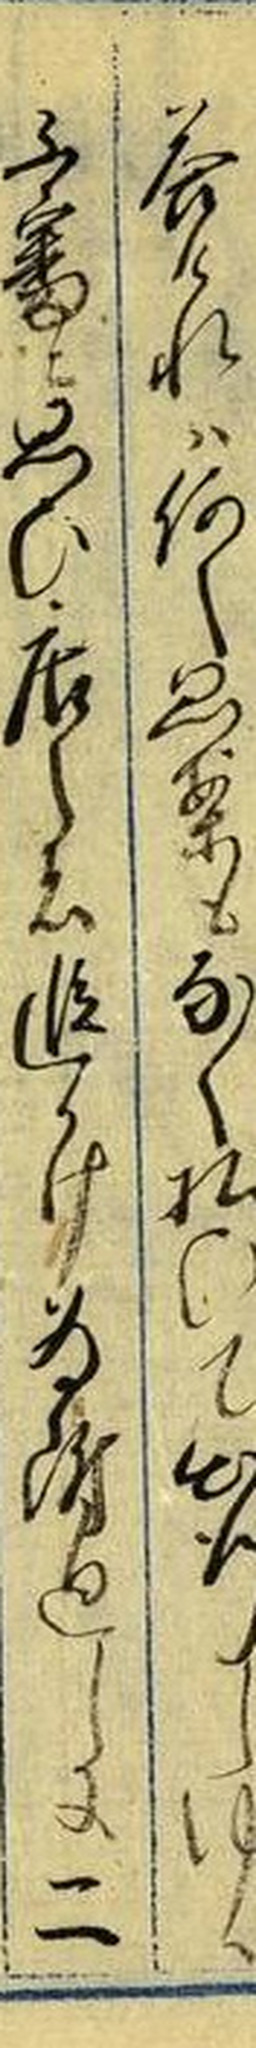不審ニ思ひ店之者追かけ為附廻しに二
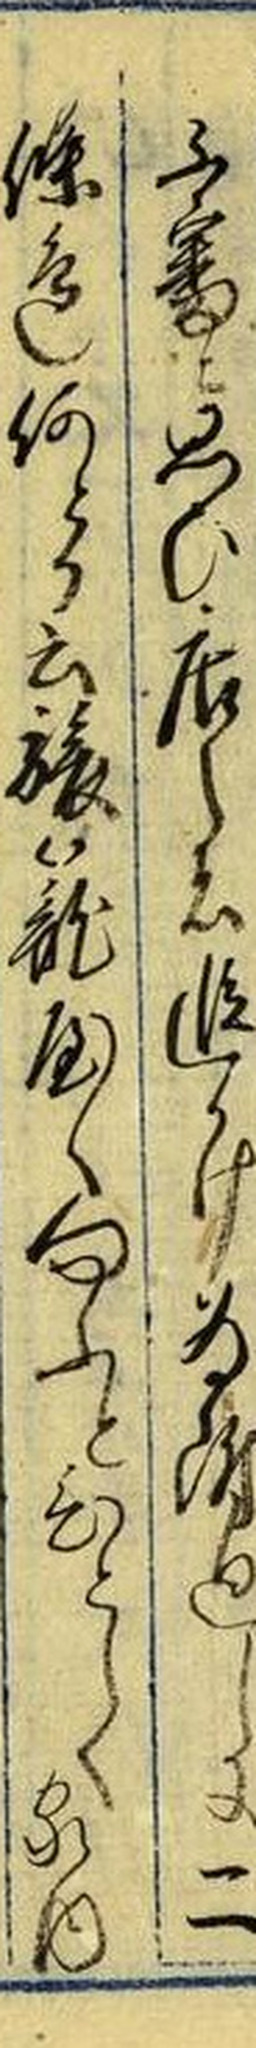條辺何とか云旅籠屋へ向ふとひとしく家内
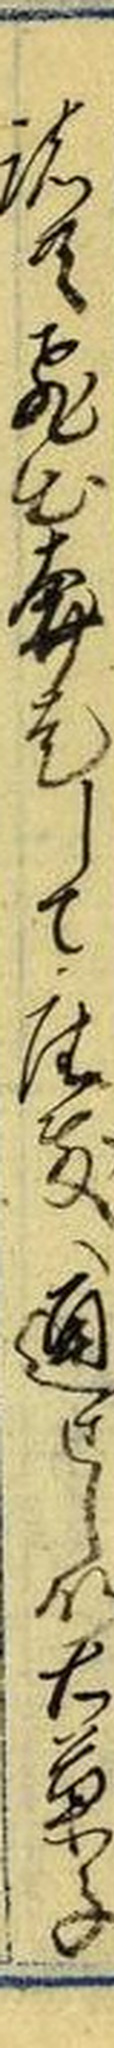諸共飛出奔走して座敷へ通せし故右菓子
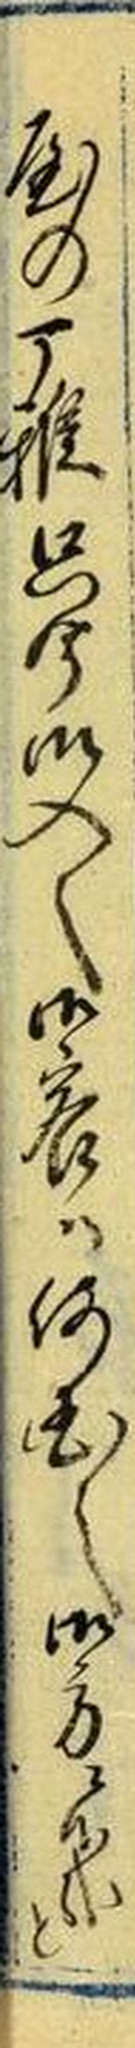屋の丁稚只今御入之御客ハ何国之御方ニ候哉と
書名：温古集 三巻
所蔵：福井県文書館 Fukui Prefectural Archives
